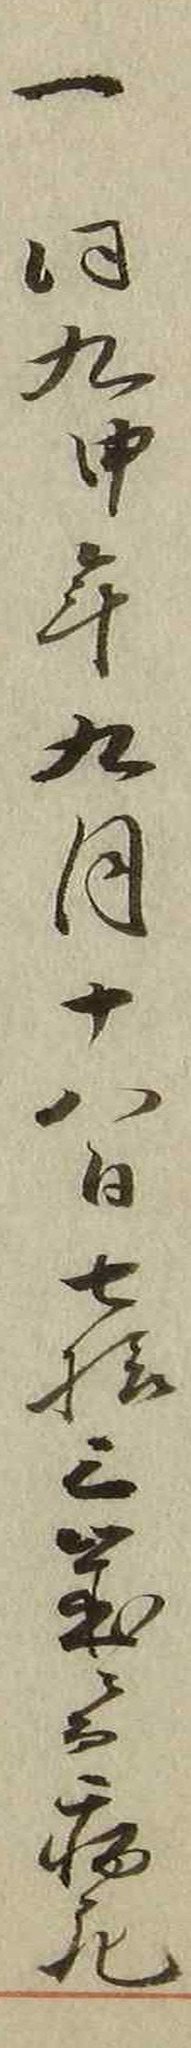一同九申年九月十八日七拾三歳ニ而病死
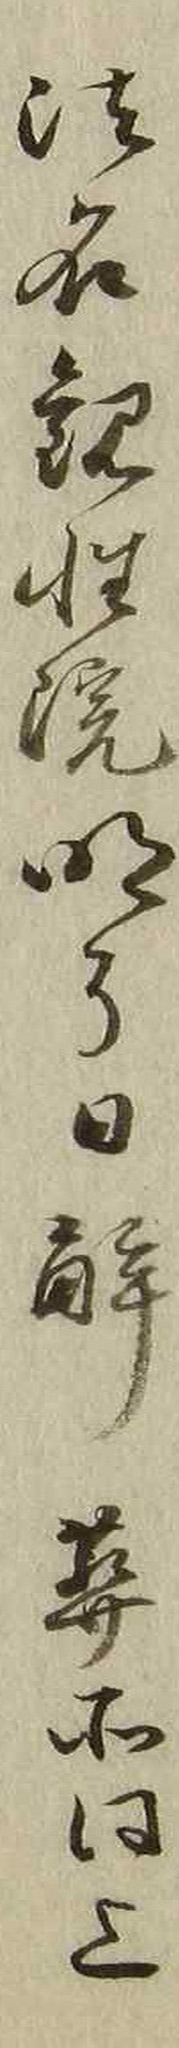法名観性院明了日解葬所同上
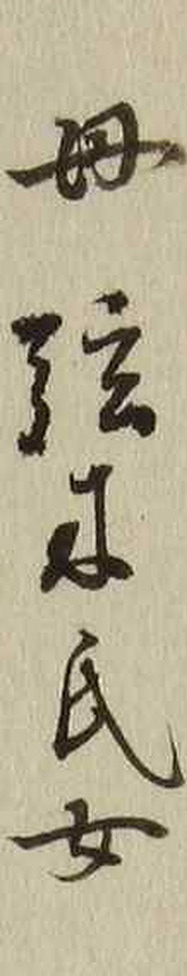母弦木氏女
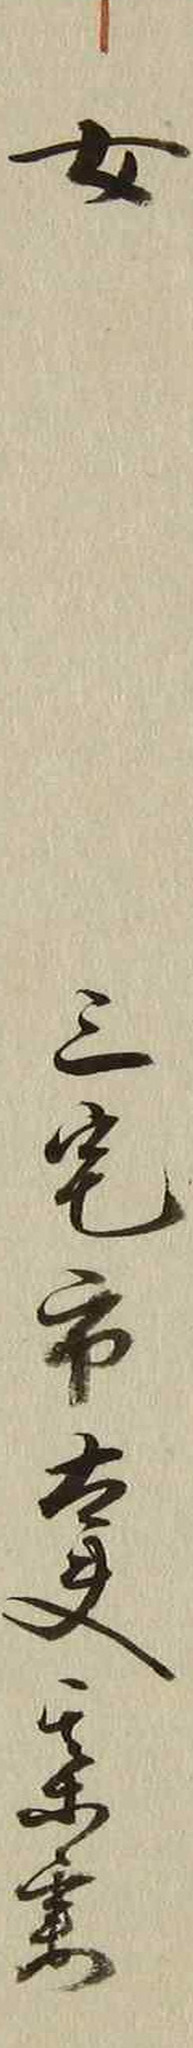女三宅市太夫某妻
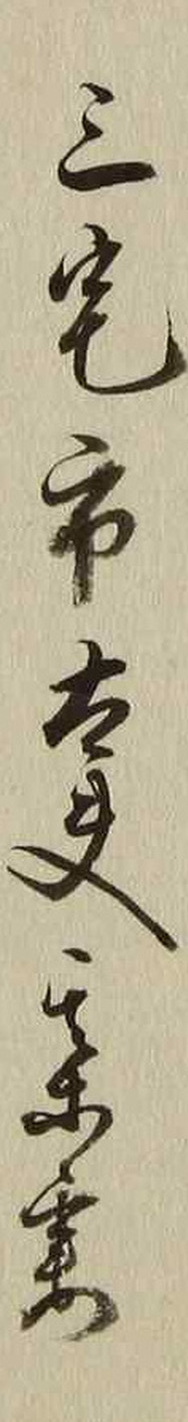女三宅市太夫某妻
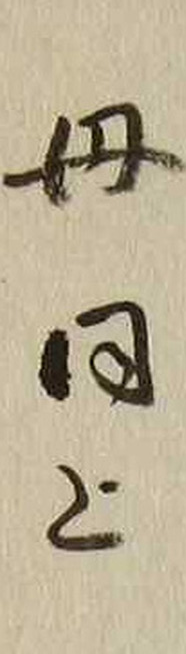母同上
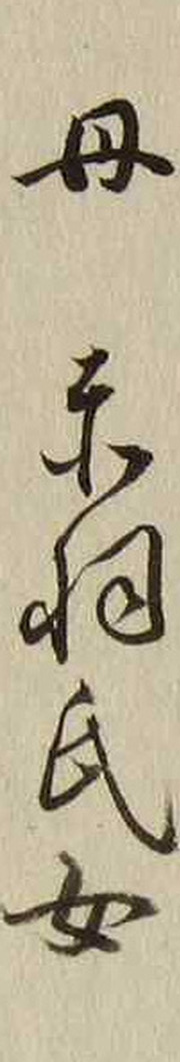母赤羽氏女
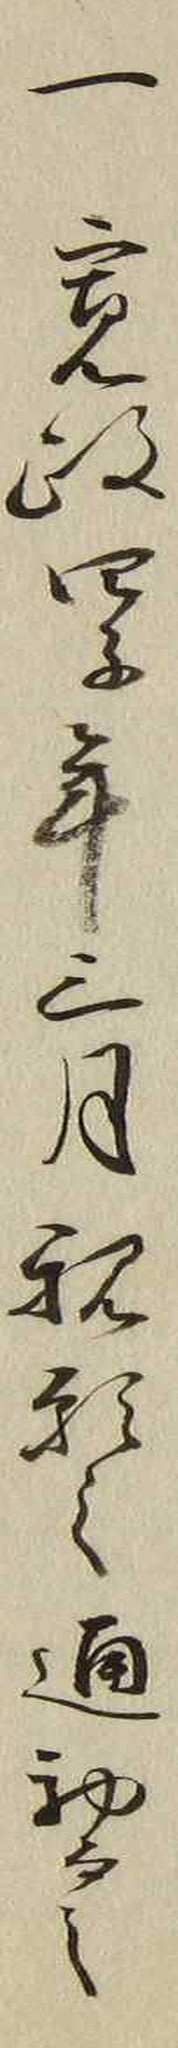一寛政四子年三月親願之通初而之
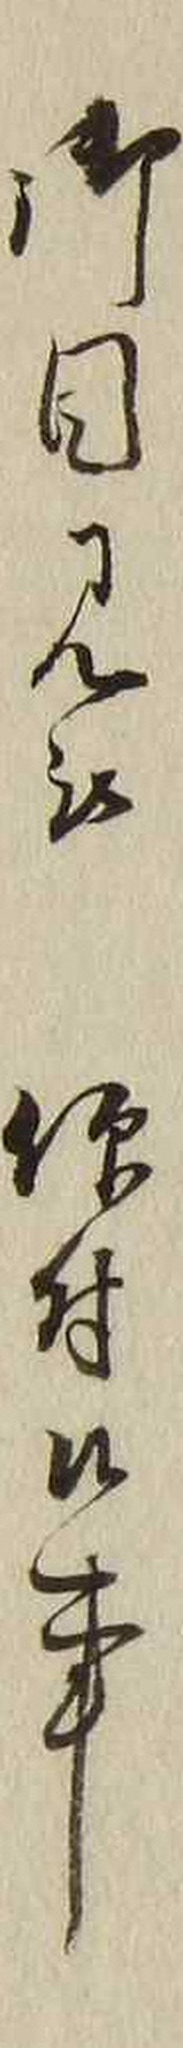御目見被仰付候事
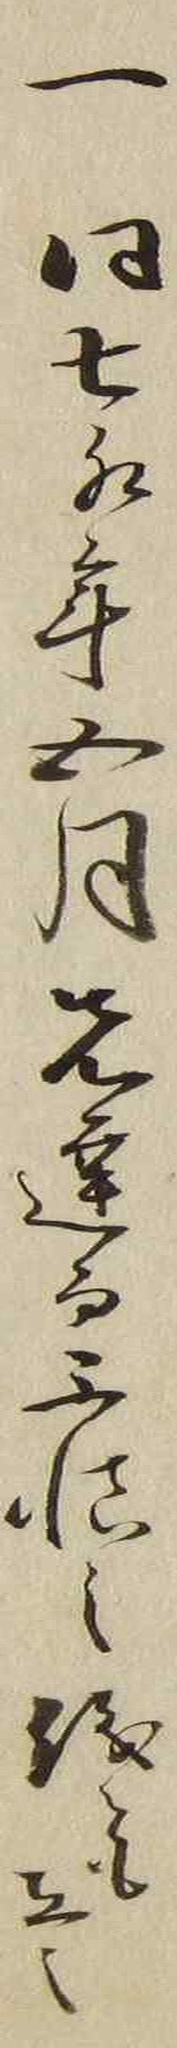一同七卯年五月先達而不慎之義も在之

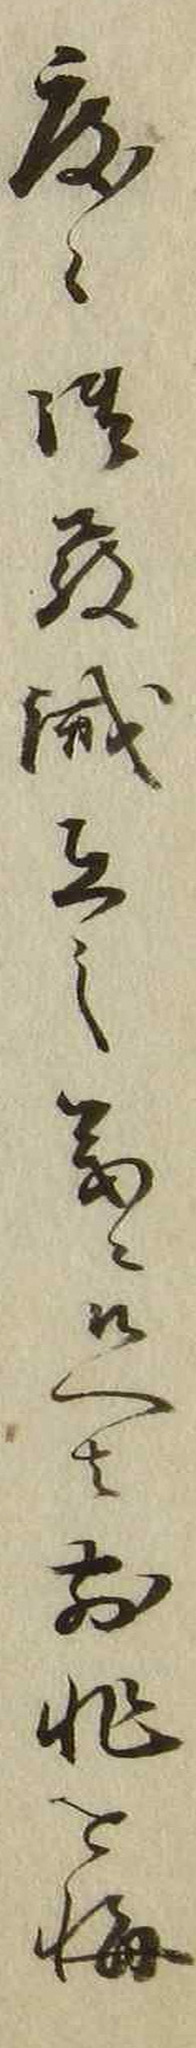度々御教誡在之義ニ候へ者前非を悔
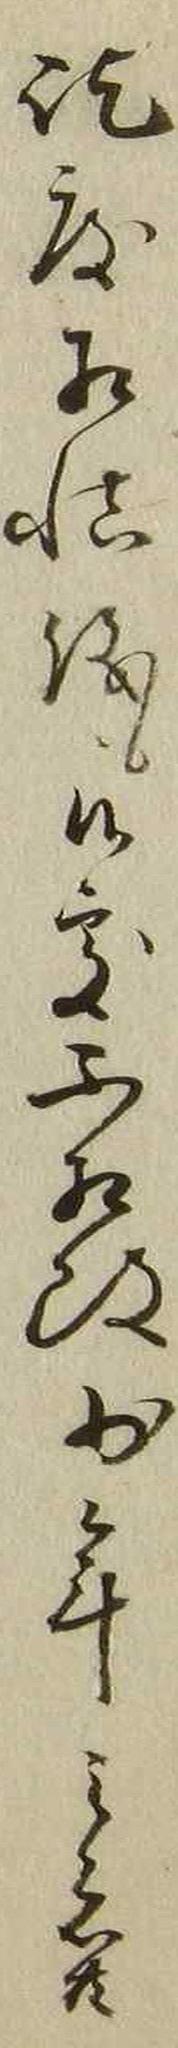訖度相慎儀も候処不相改少年之者共
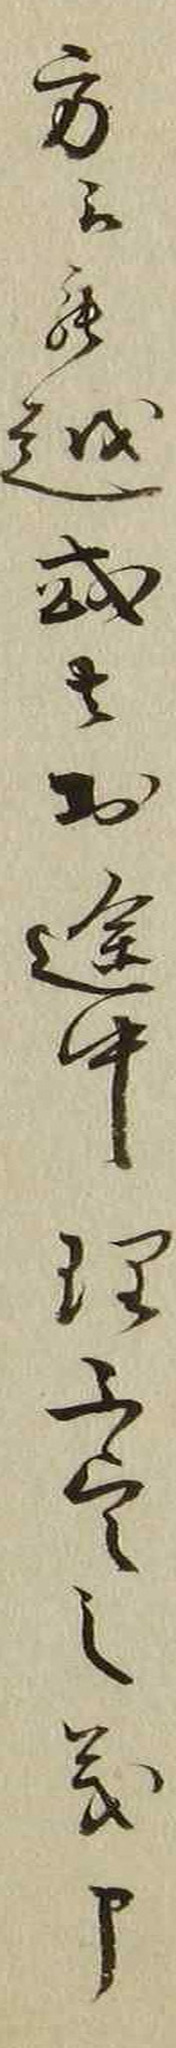方江罷越或者於途中理不尽之義申
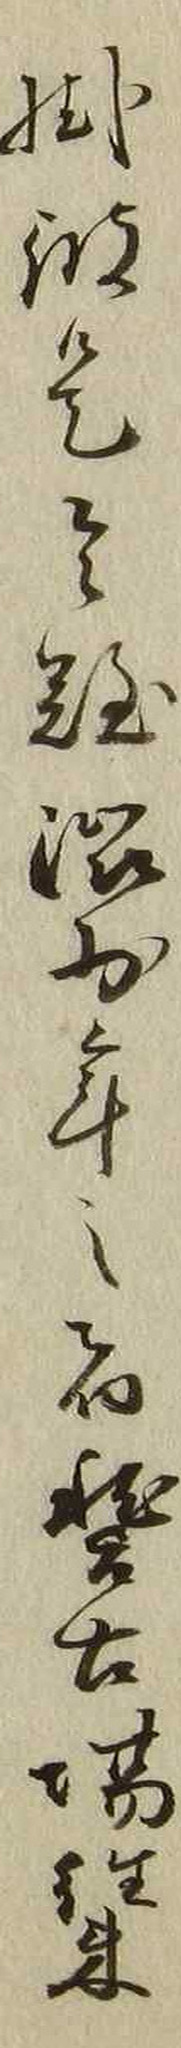掛彼是令難渋少年之者稽古場往来
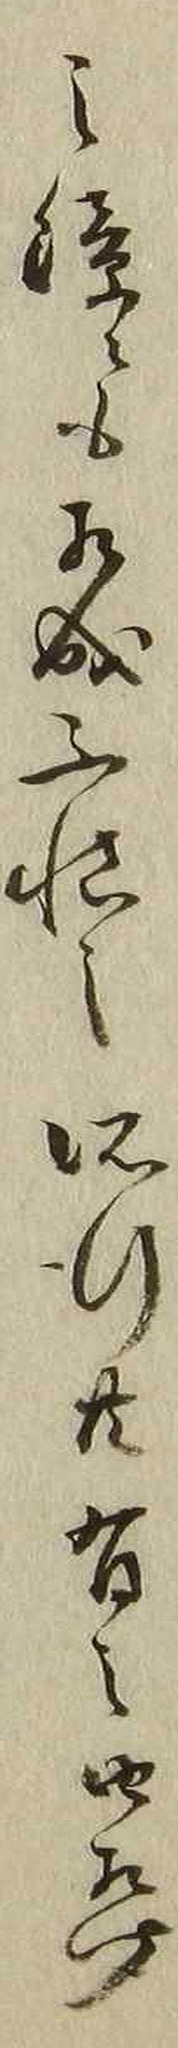之障ニも相成不慎之所行共有之由相聞
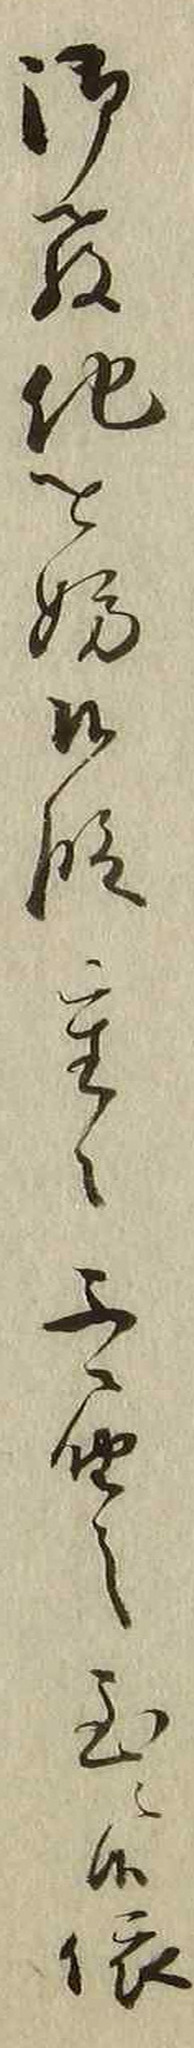御教地を妨候段重々不届之至ニ候依
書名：諸士系譜　巻之26　い之部26
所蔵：会津若松市立会津図書館
